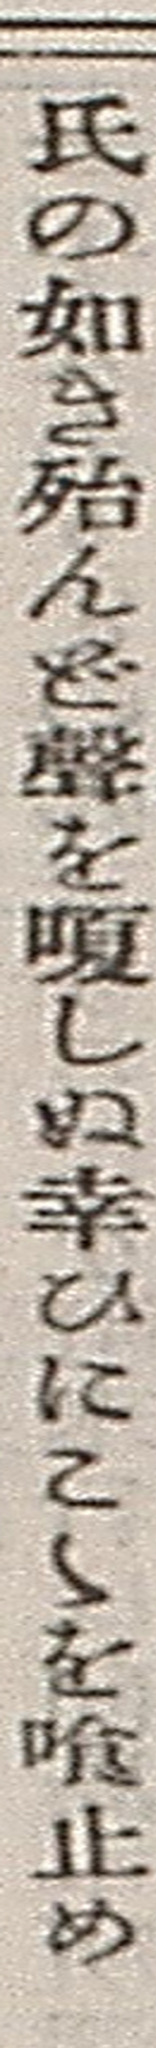氏の如き殆んど声を嗄しぬ幸ひにこゝを喰止め
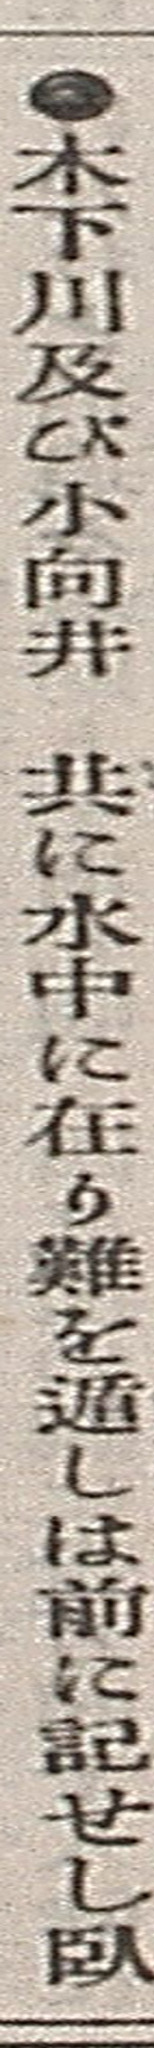●木下川及び小向井共に水中に在り難を遁しは前に記せし臥
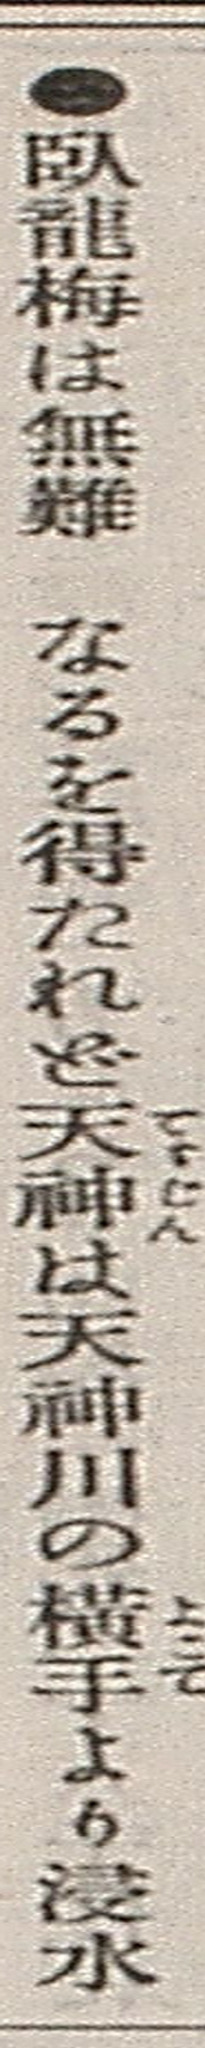●臥龍梅は無難なるを得たれど天神は天神川の横手より浸水
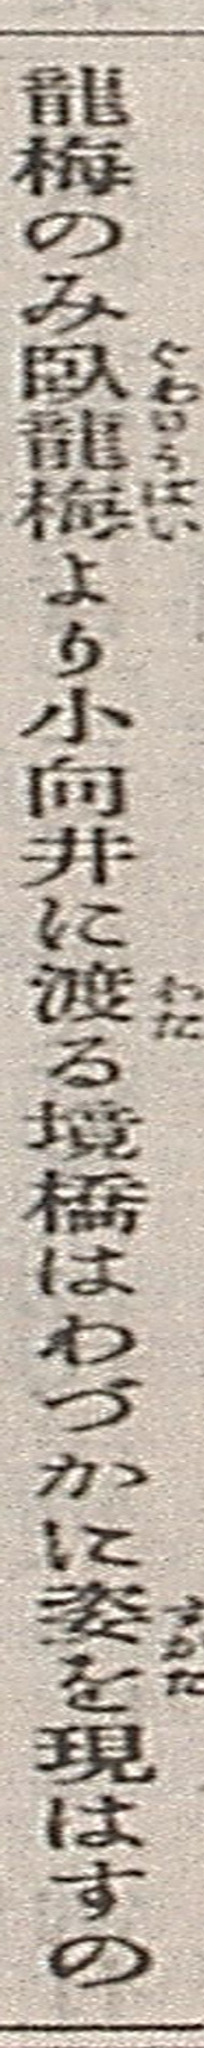龍梅のみ臥龍梅より小向井に渡る境橋はわづかに姿を現はすの
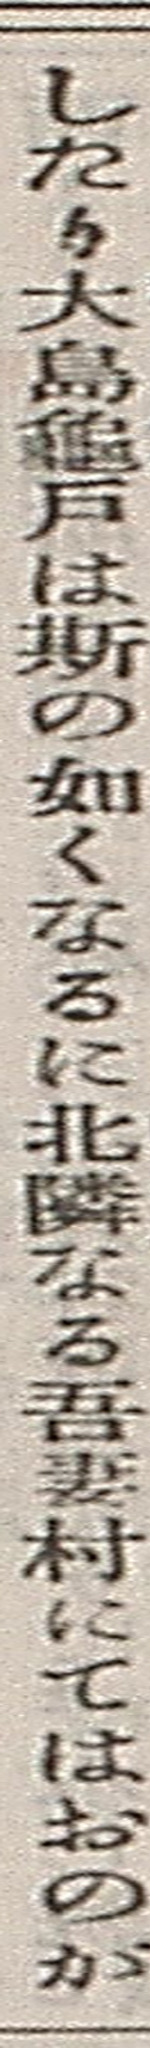したり大島亀戸の斯の如くなるに北隣なる吾妻村にてはおのが
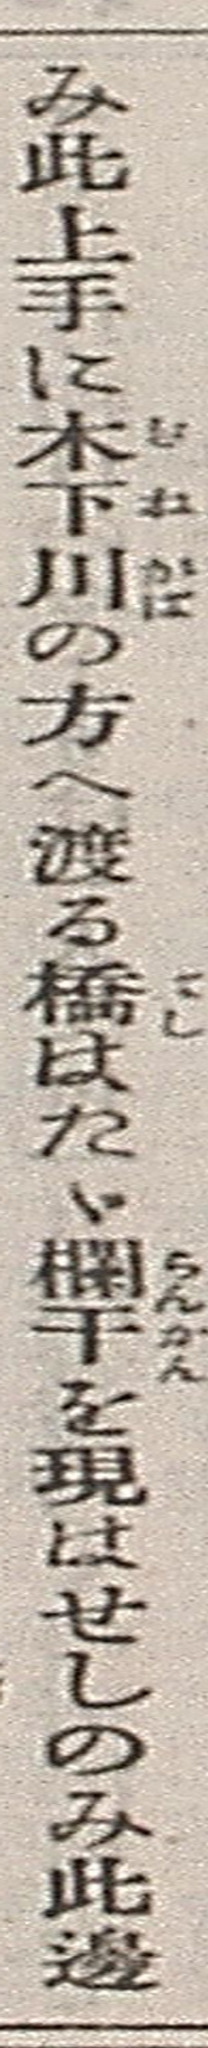み此上手に木下川の方へ渡る橋はたゞ欄干を現はせしのみ此辺
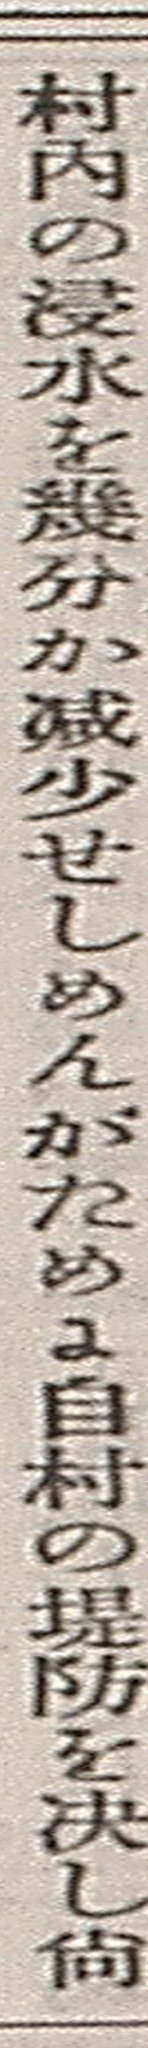村内の浸水を幾分か減少せしめんがために自村の堤防を决し尚
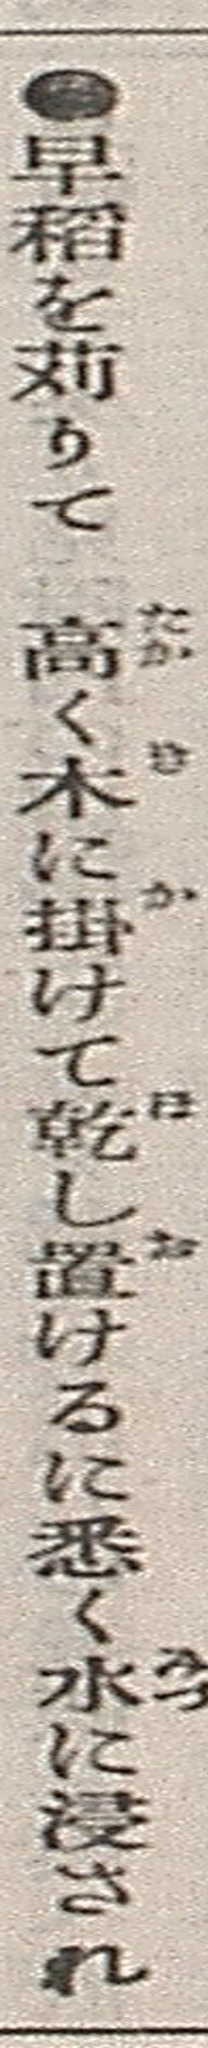●早稲を苅りて高く木に掛けて乾し置けるに悉く水に浸され
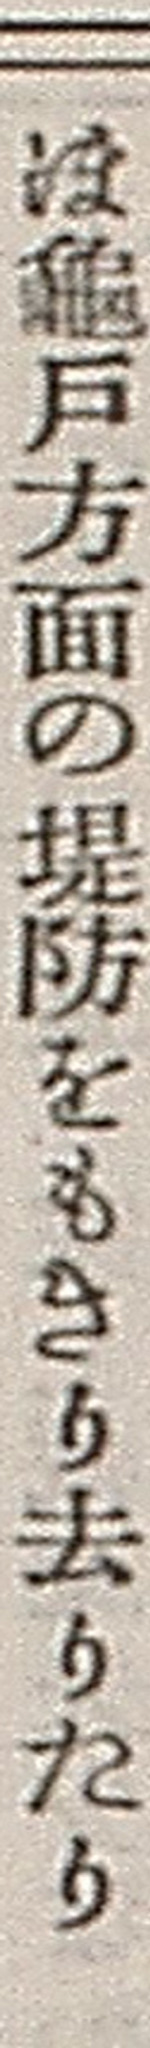ほ亀戸方面の堤防をもきり去りたり
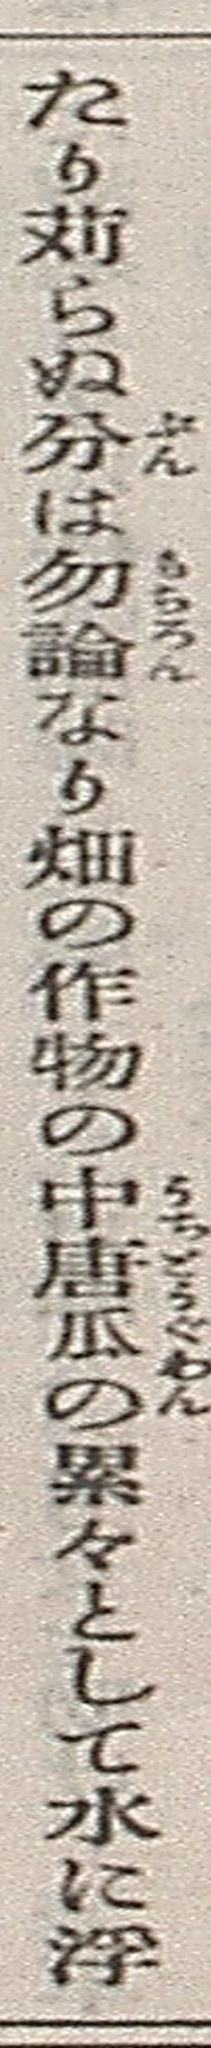たり苅らぬ分は勿論なり畑の作物の中唐瓜の累々として水に浮
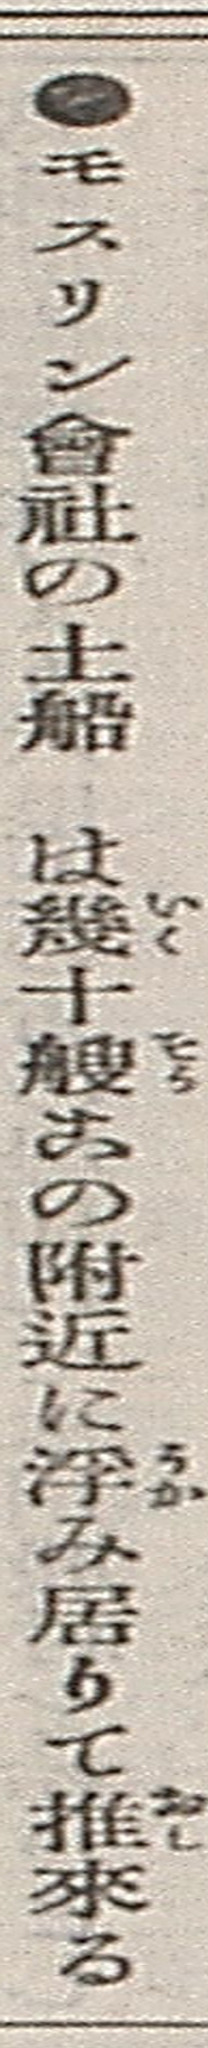●モスリン会社の土船は幾十艘この附近に浮み居りて推来る
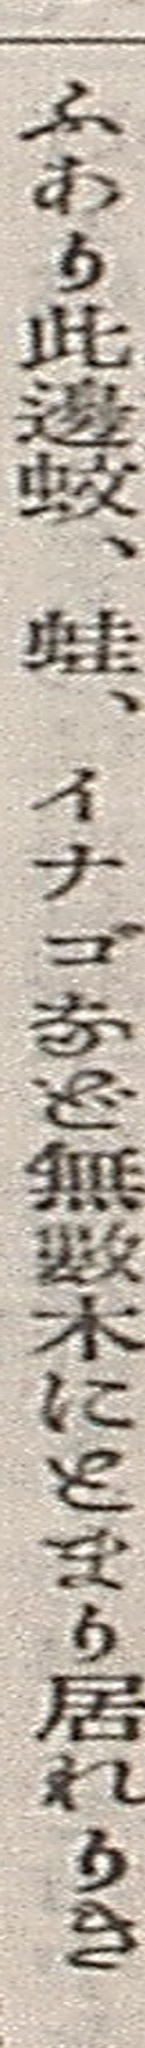ふあり此辺蚊、蛙、イナゴなど無数木にとまり居れりき
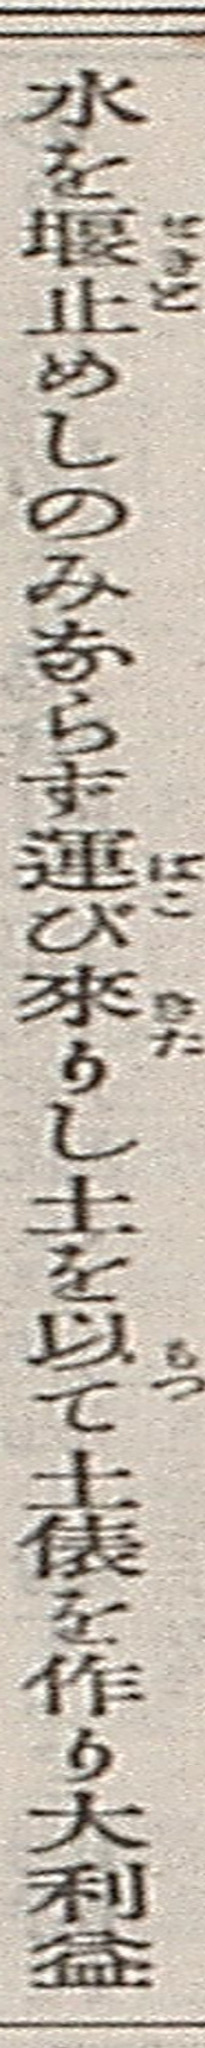水を堰止めしのみならず運び来りし土を以て土俵を作り大利益
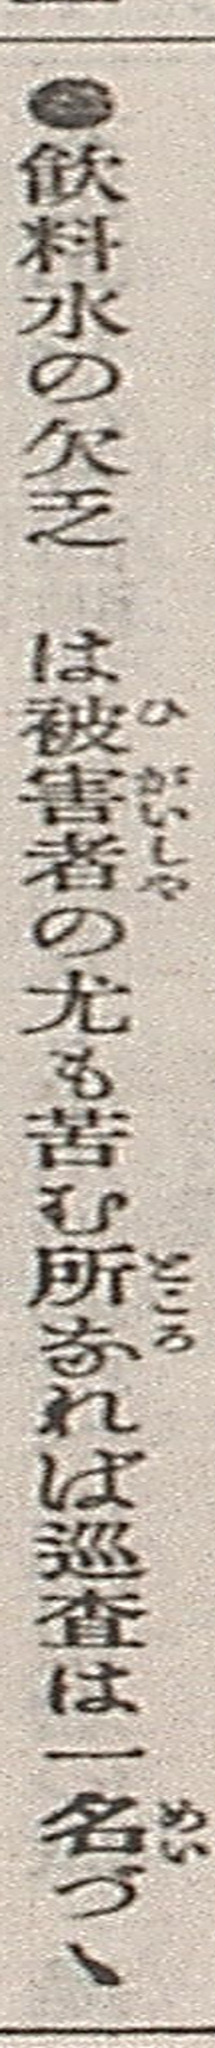●飲料水の欠乏は被害者の尤も苦む所なれば巡査は一名づゝ
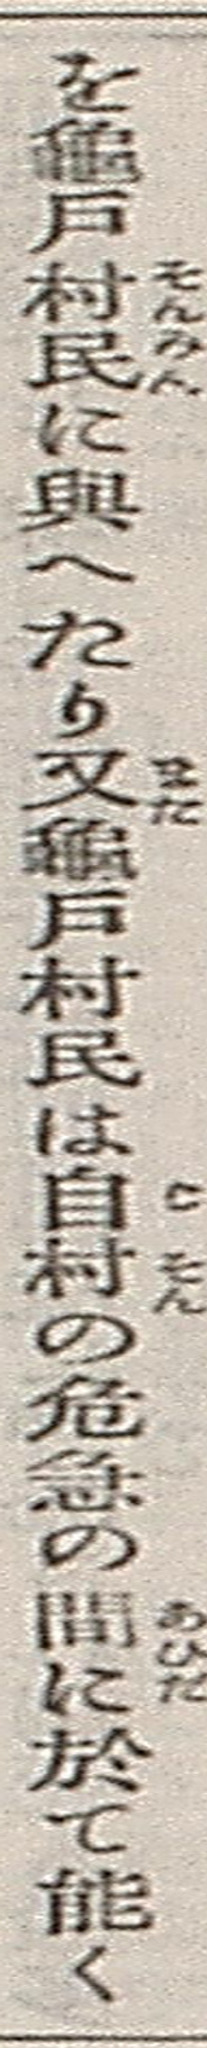を亀戸村民に与へたり又亀戸村民は自村の危急の間に於て能く
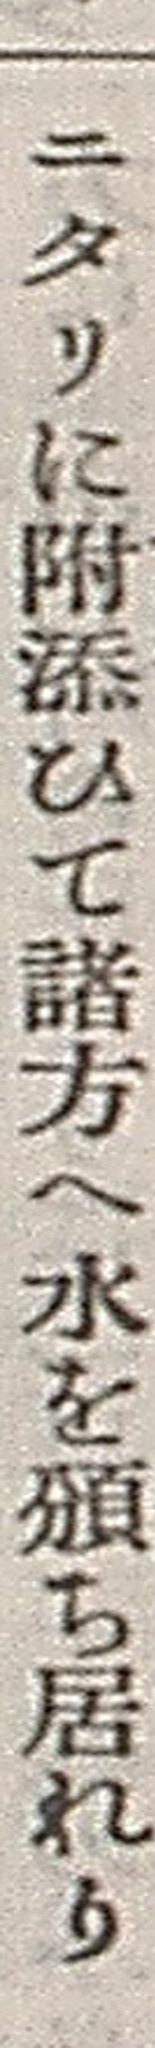ニタリに附添ひて諸方へ水を頒ち居れり
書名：風俗畫報臨時増刊第百二十四號　洪水地震被害録（上）
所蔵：東京大学地震研究所図書室 Earthquake Research Institute Library, The University of Tokyo, JAPAN
